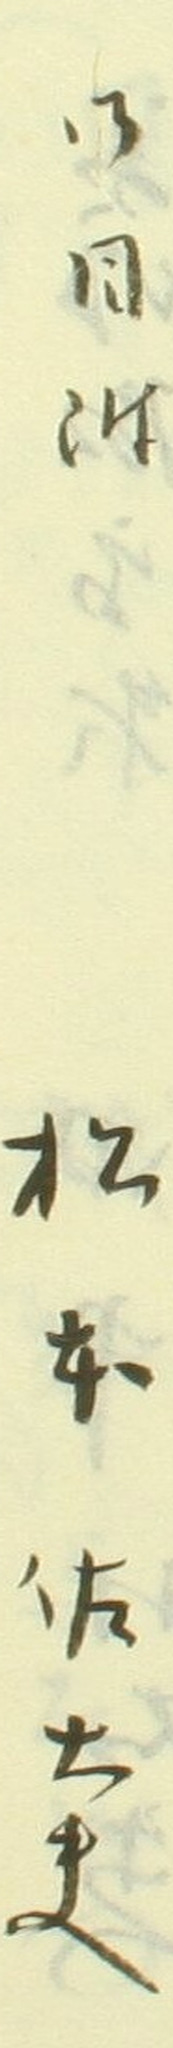御目附松本佐太夫
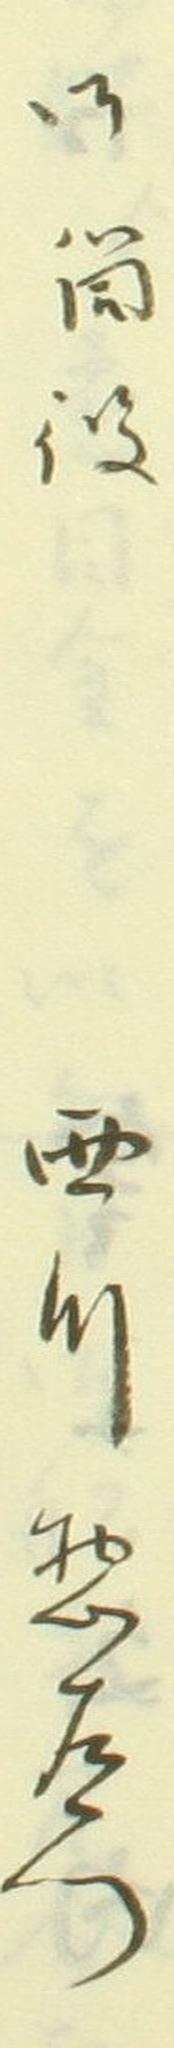御筒役西川惣左衛門
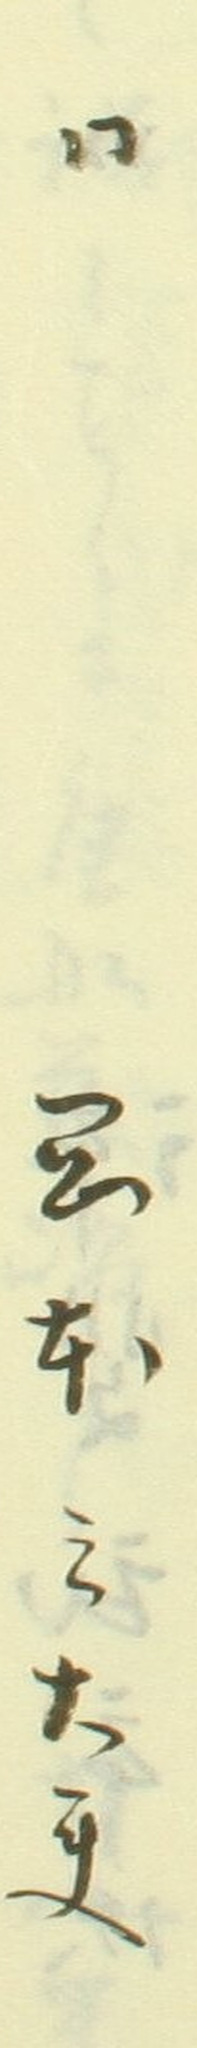同岡本三太夫
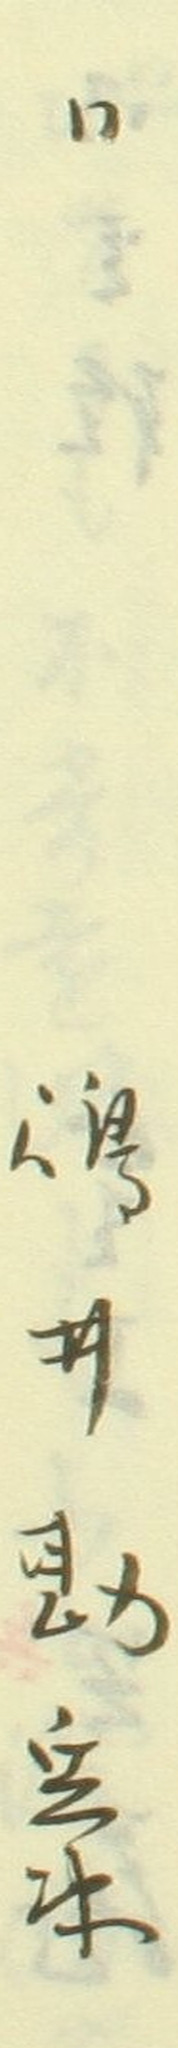同嶋井勘太夫
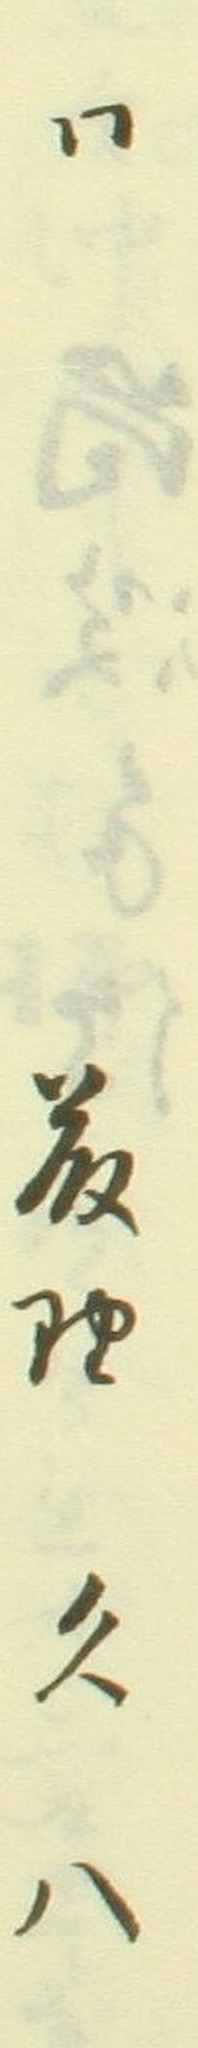同藤野久八
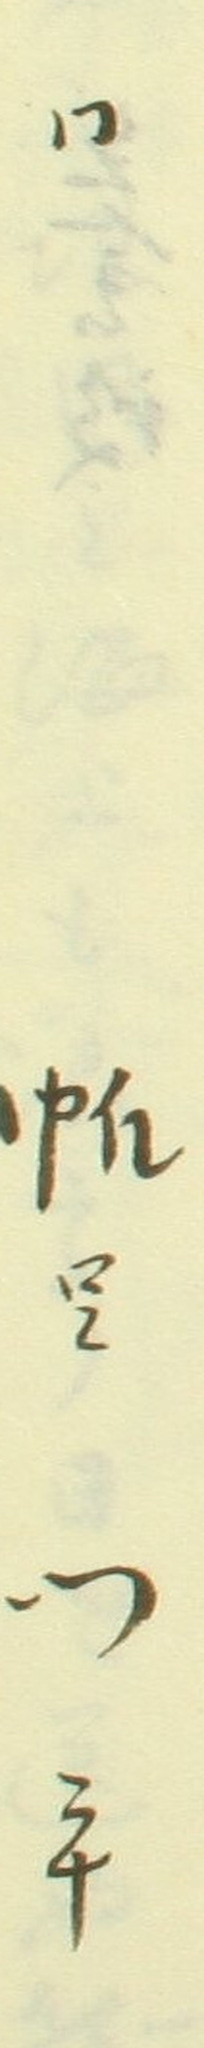同帆足門平
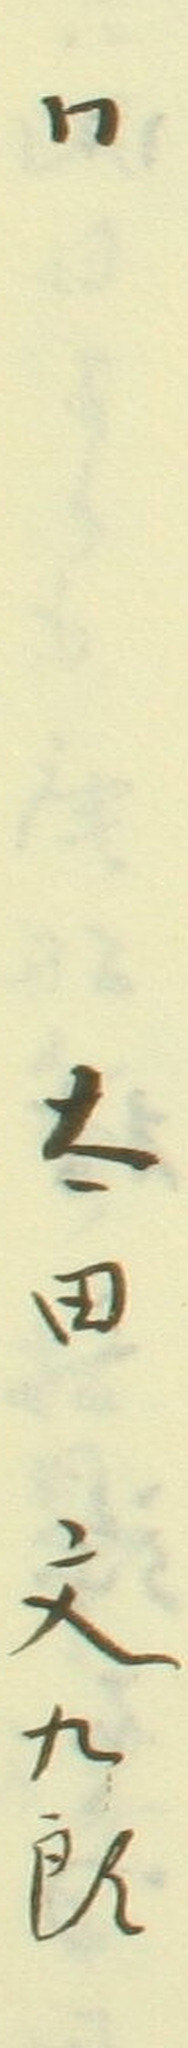同太田文九朗
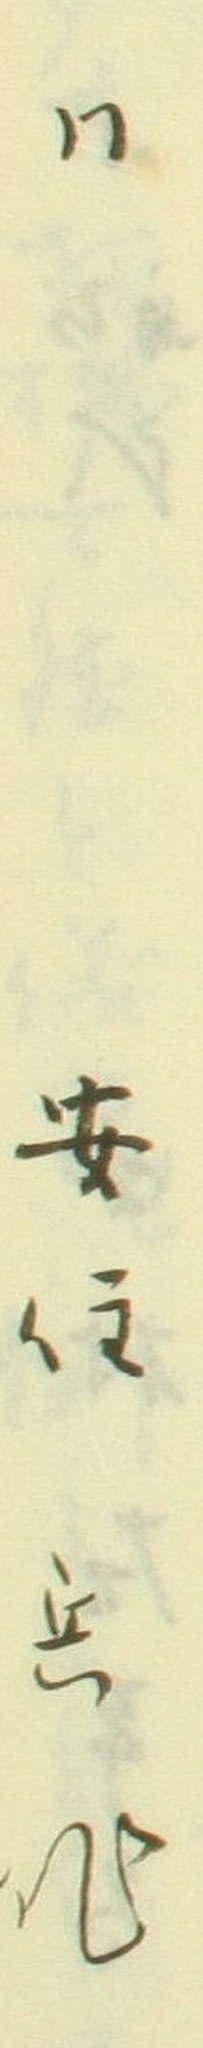同安住兵作

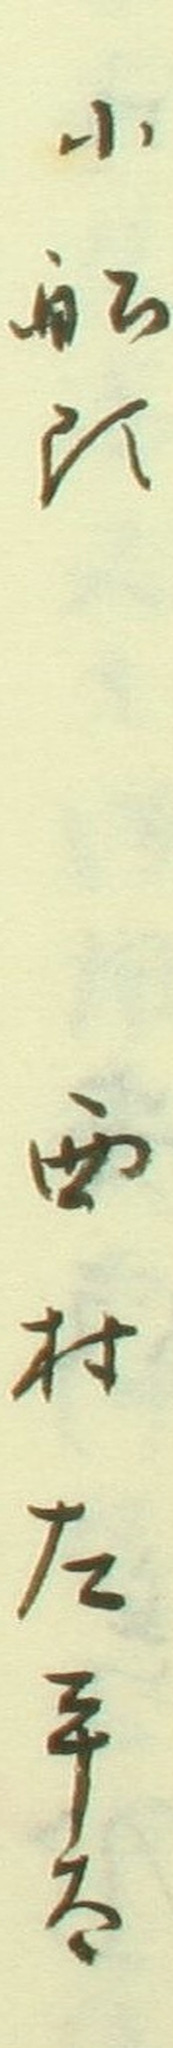小船頭西村左平次
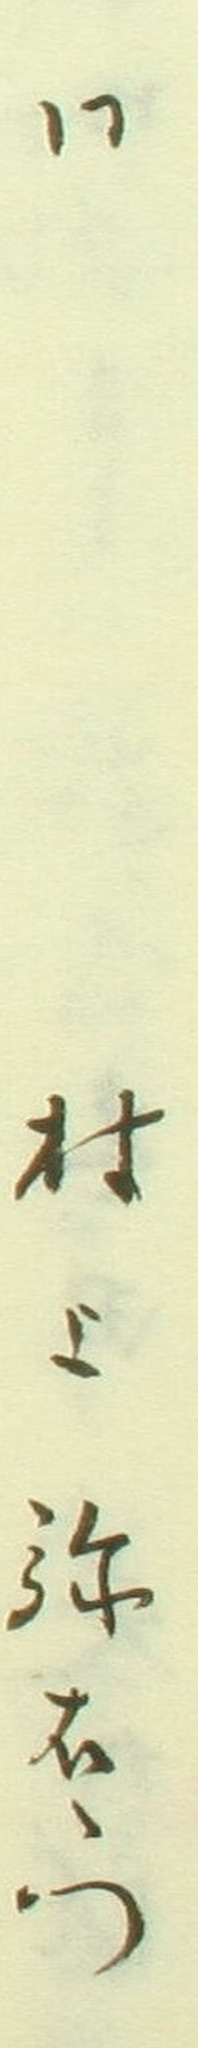同村上弥右衛門
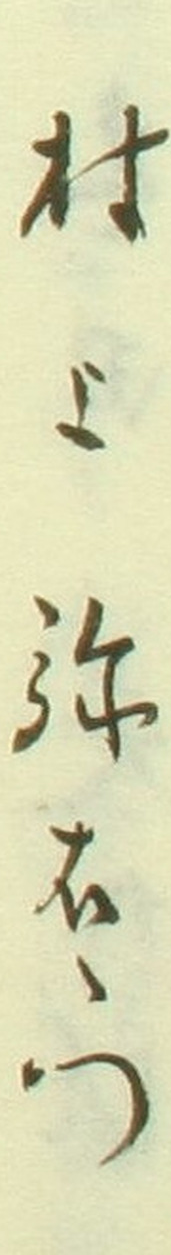同村上弥右衛門
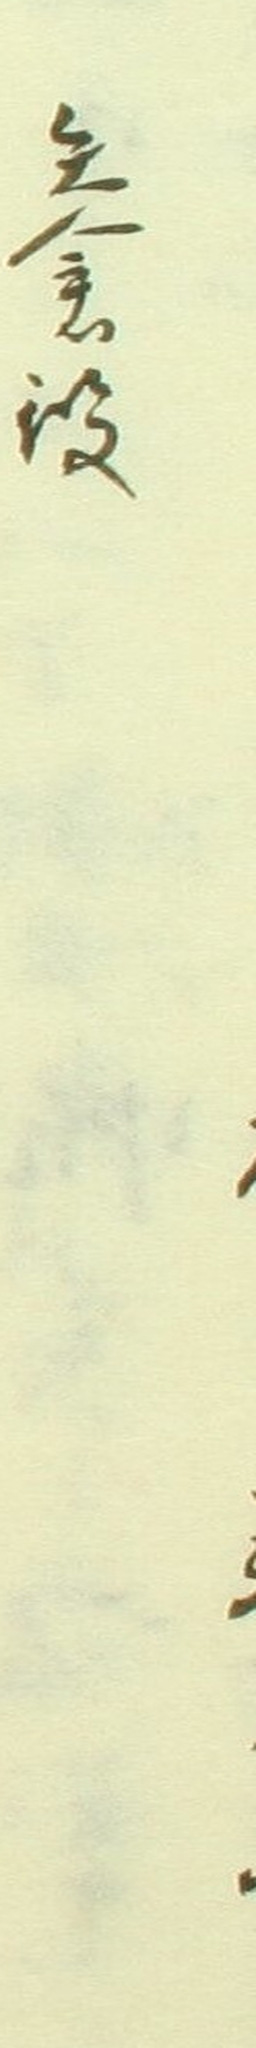矢倉役
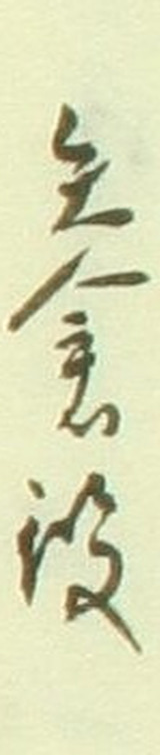矢倉役
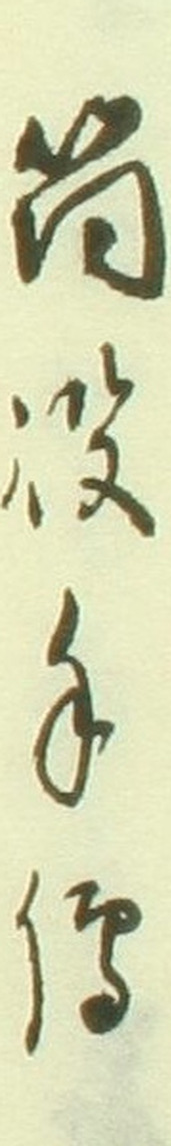筒役手伝
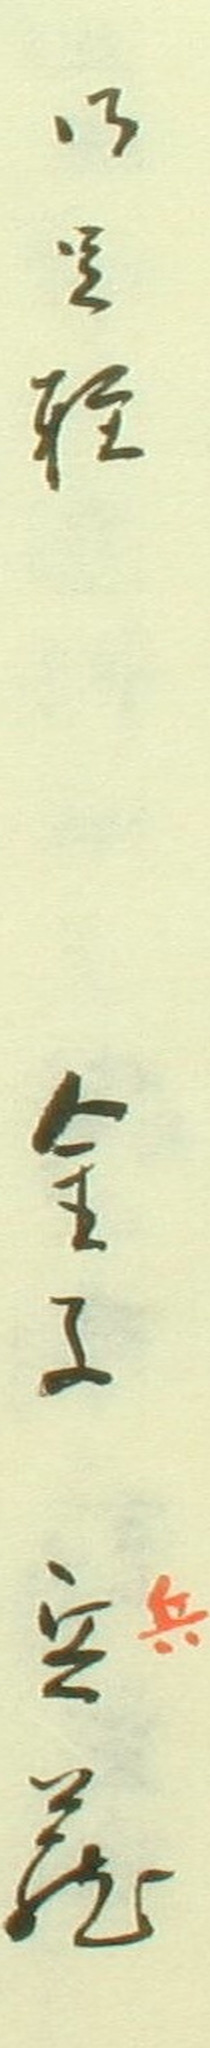御足軽金子兵蔵
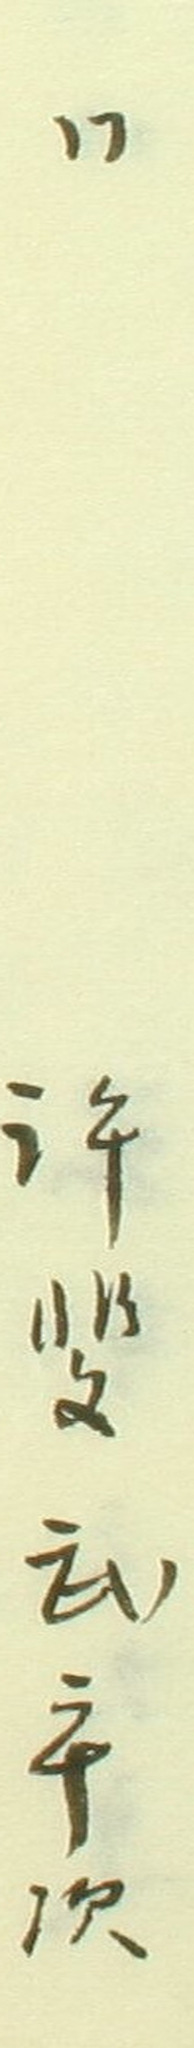同許斐武平次
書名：唐船漂流記 三
